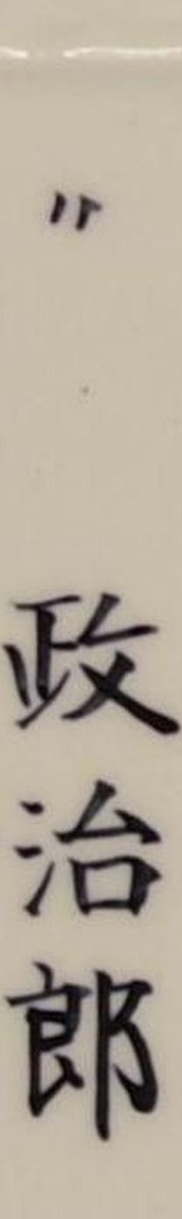政治郎
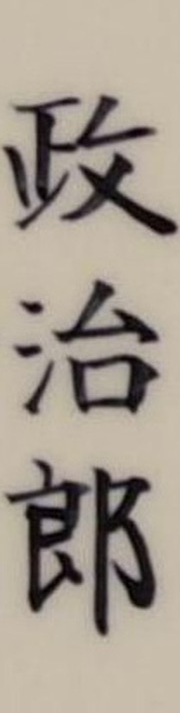政治郎
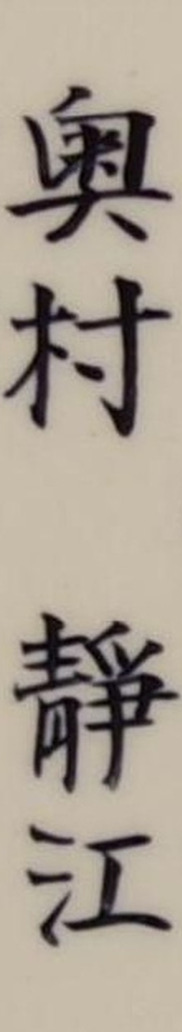奥村静江
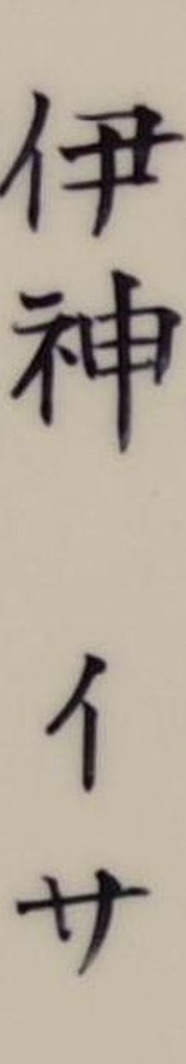伊神イサ
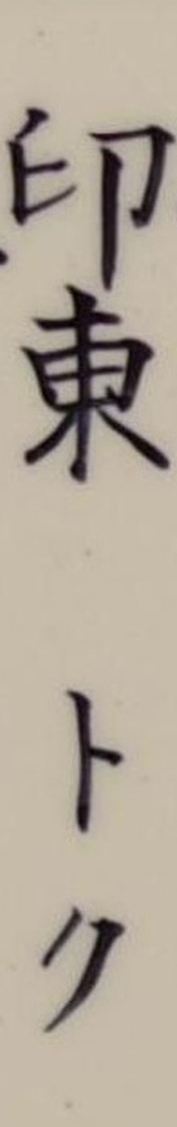印東トク
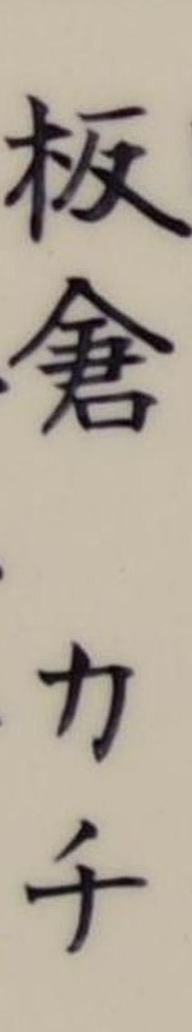板倉カチ
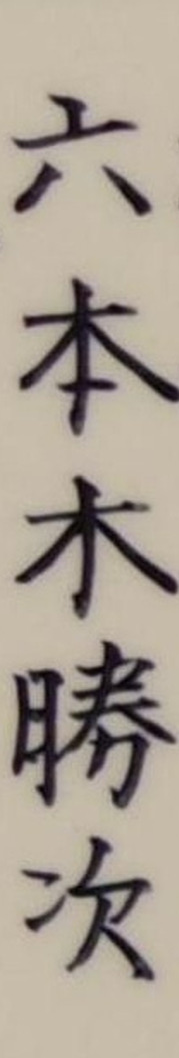六本木勝次
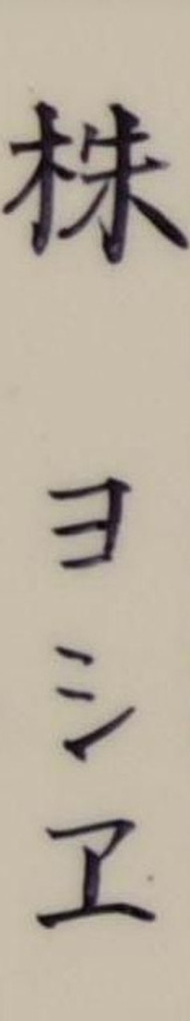株ヨシエ
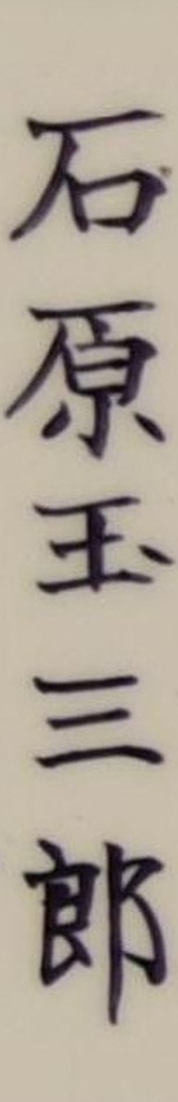石原玉三郎

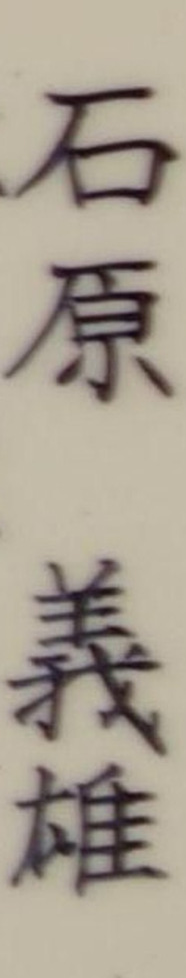石原義雄
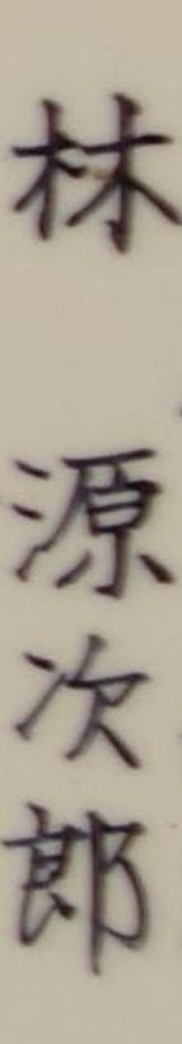林源次郎
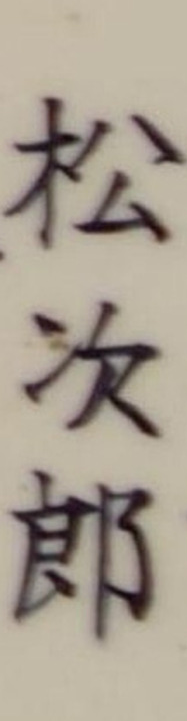松次郎
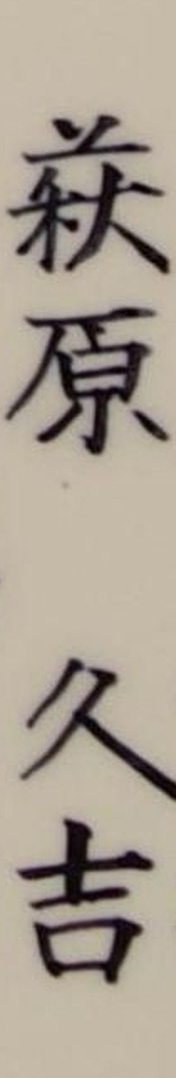萩原久吉
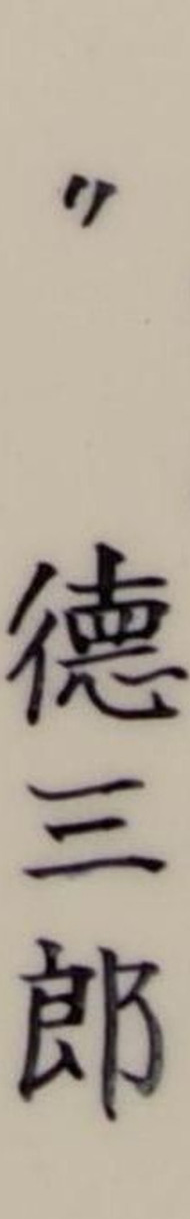徳三郎
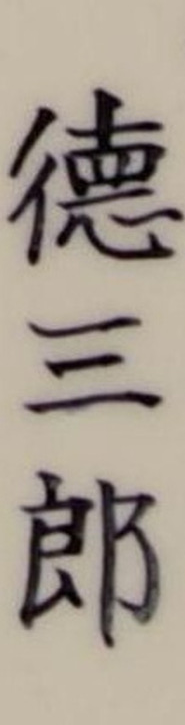徳三郎
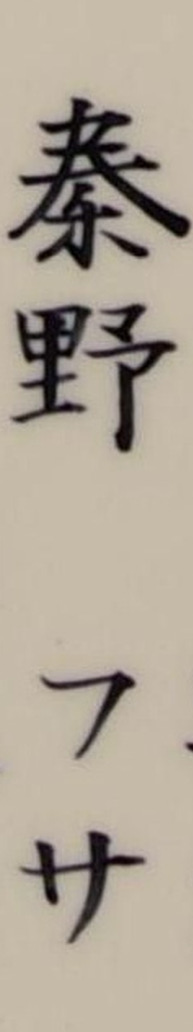秦野フサ
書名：M~S
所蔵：高野山金剛峯寺
